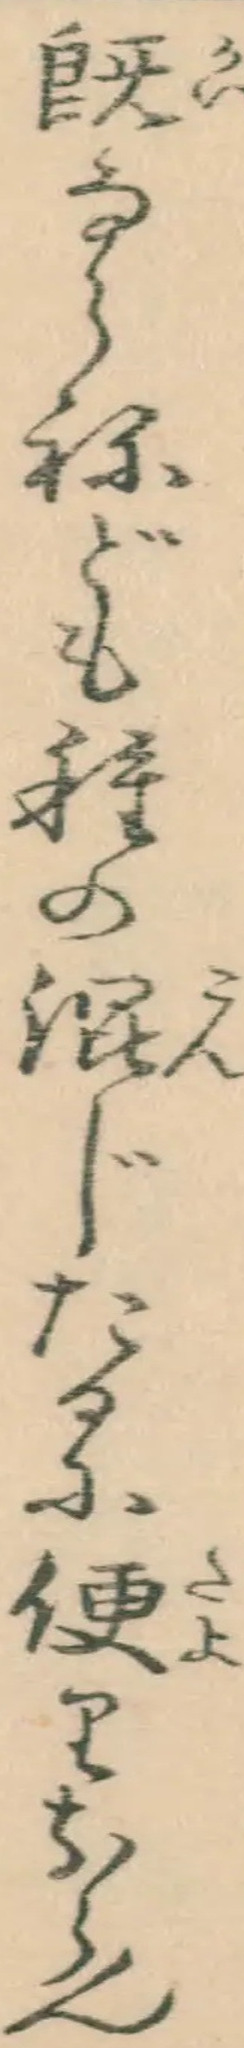既ならねども種の混じたるに便りならん
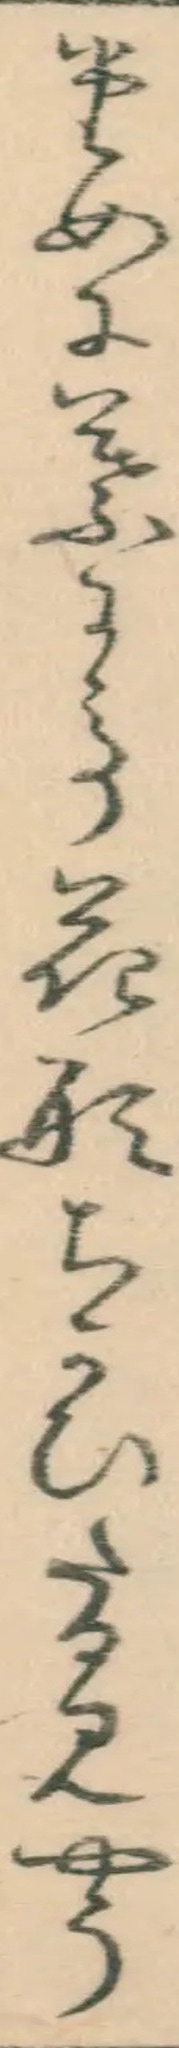ために葉にて花形ちかひたる見やう
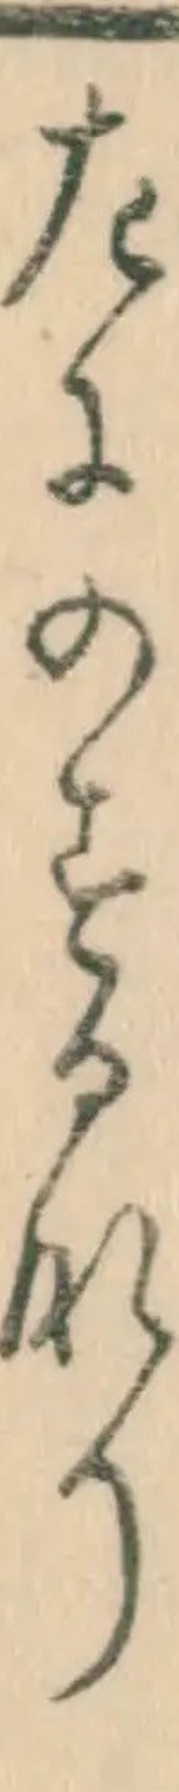左にのするなり
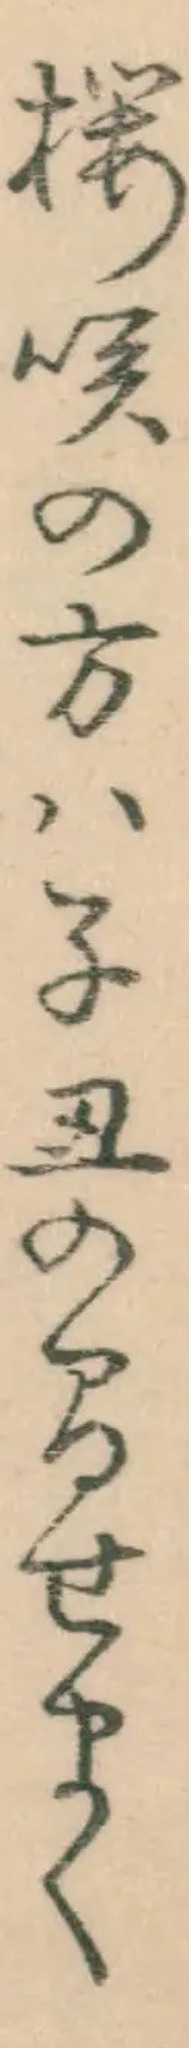子寅桜咲の方ハ子丑の間せまく
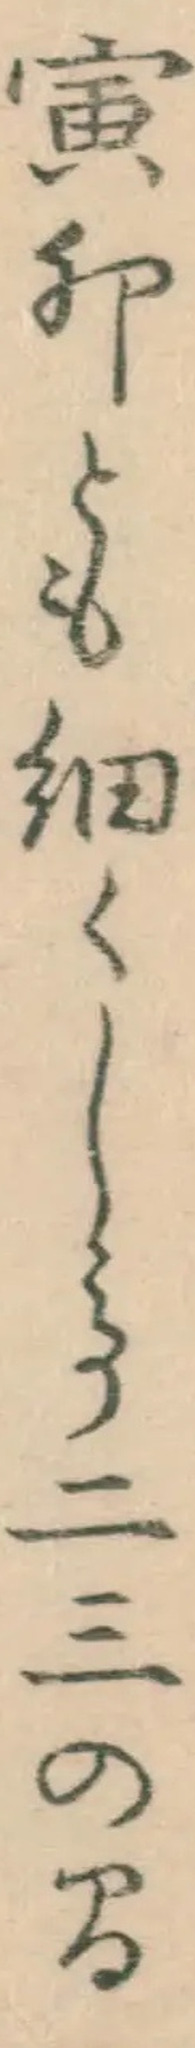丑卯寅卯とも細くして二三の間
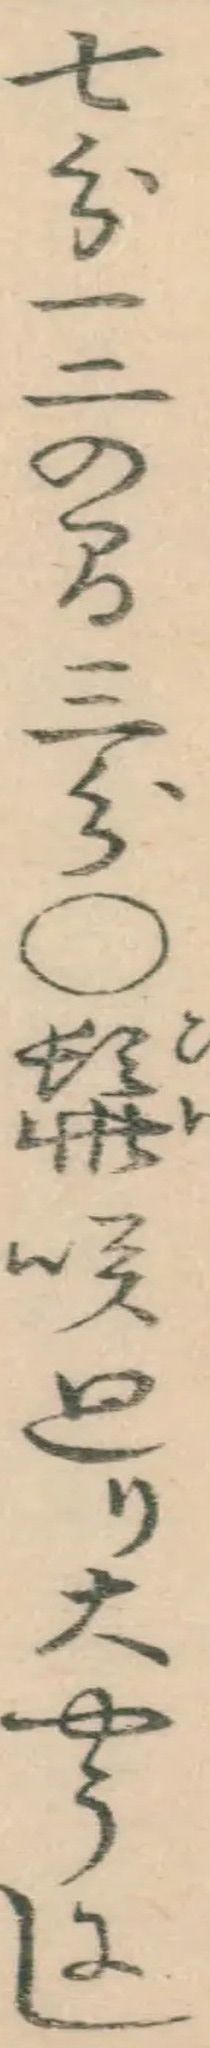七分一二の間三分〇髭咲廻り大やうにし
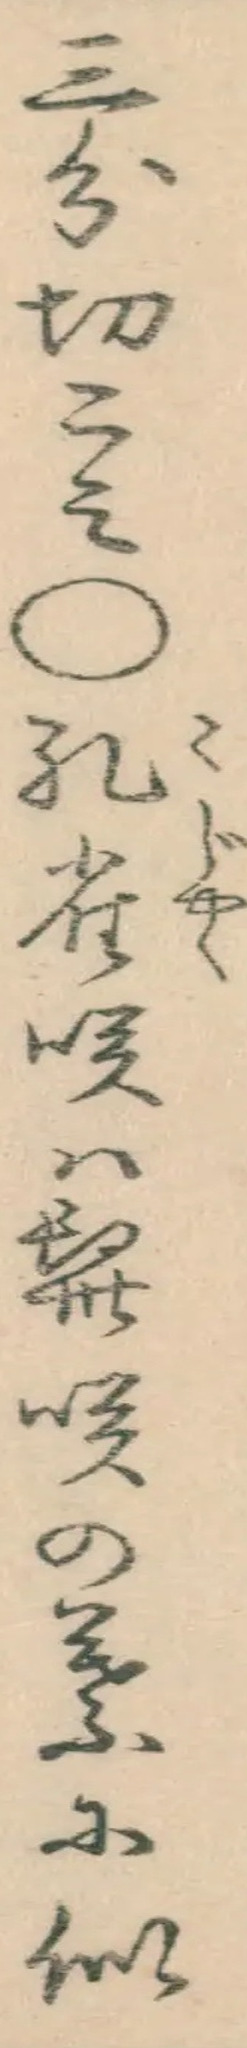三分切ニテ〇孔雀咲ハ髭咲の葉に似
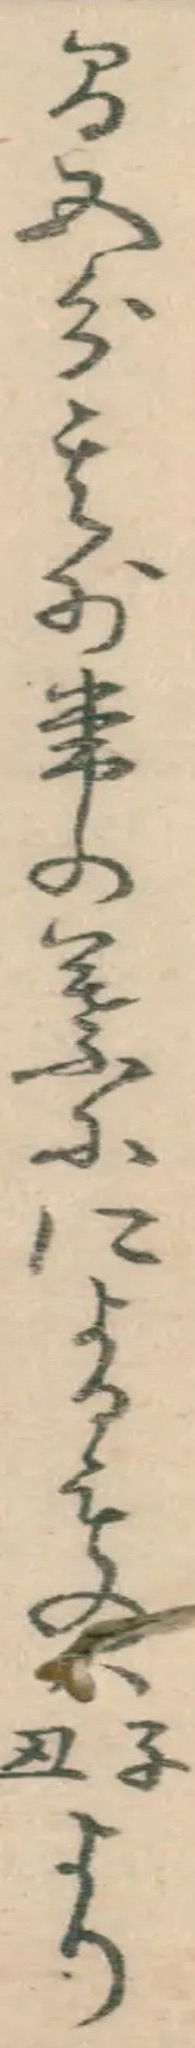間五分其外常の葉によるものハ子丑より

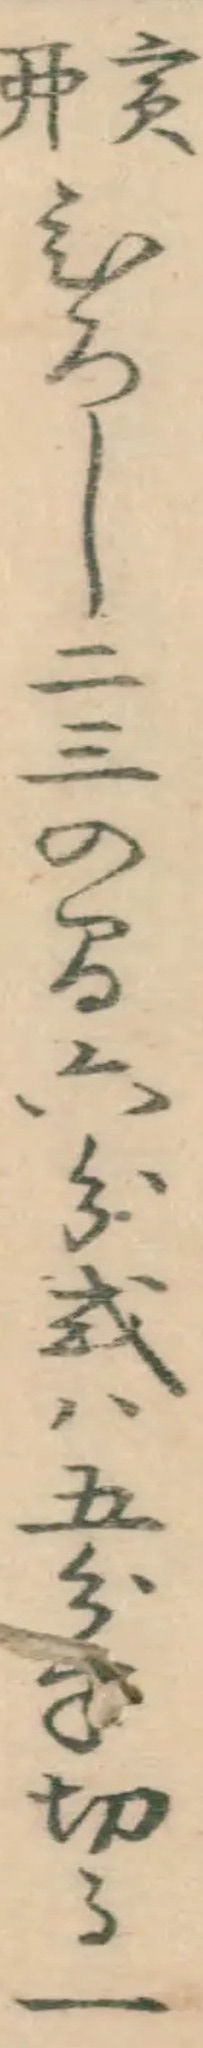寅卯ひろし二三の間六分或ハ五分半切る一
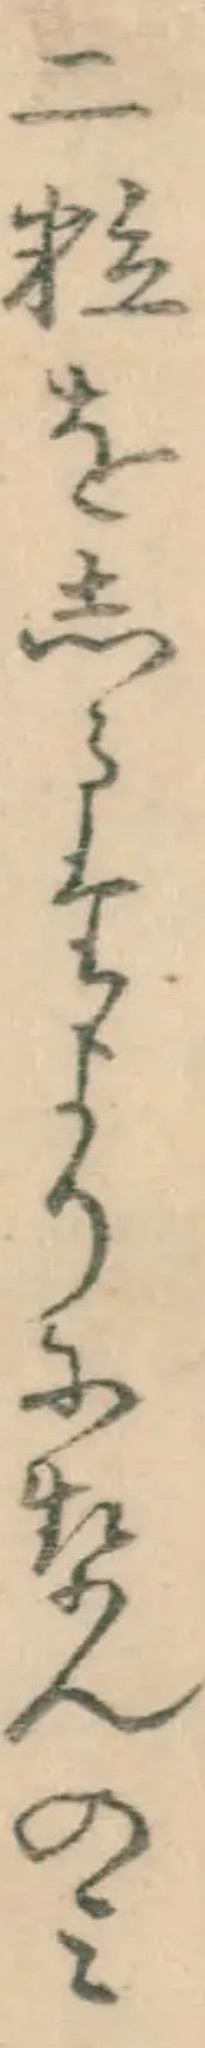二粒をしるたよりにせんのミ
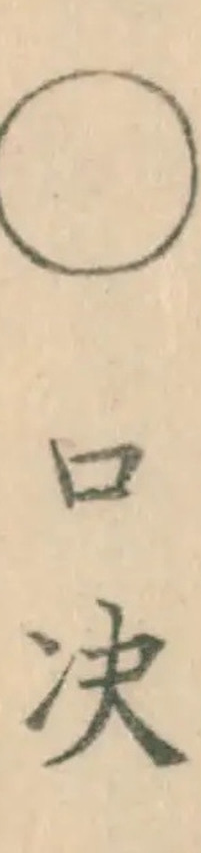〇口決
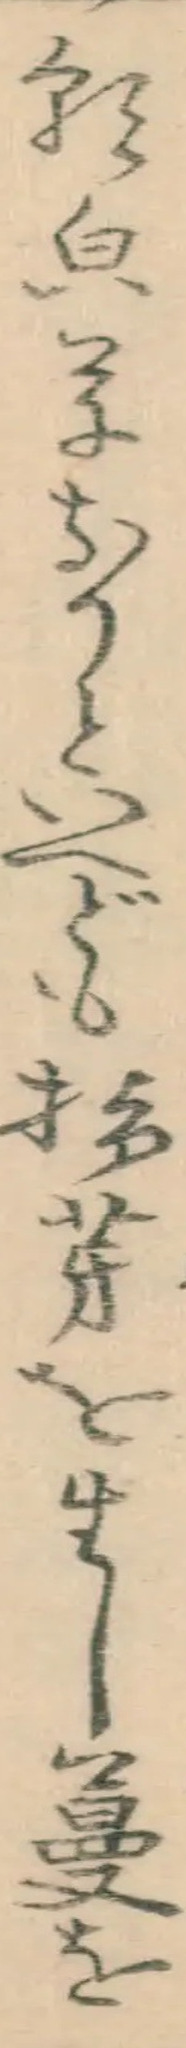朝貌草なりといへども指芽を生し蔓を
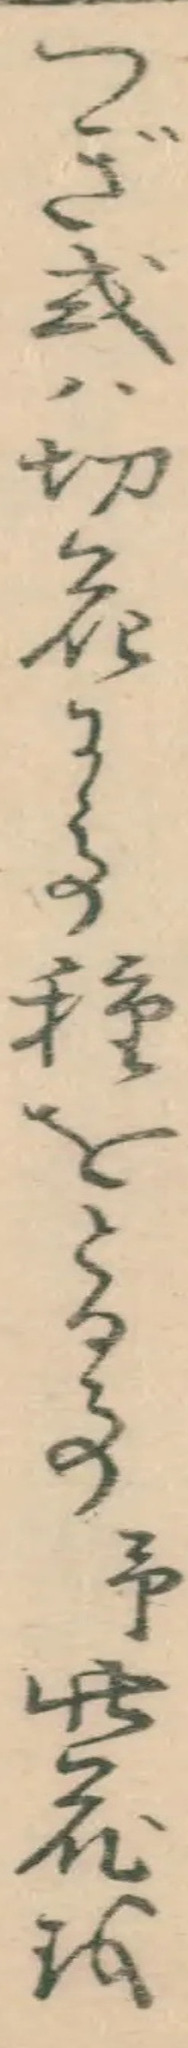つぎ或ハ切花にして種をとる事予此花を
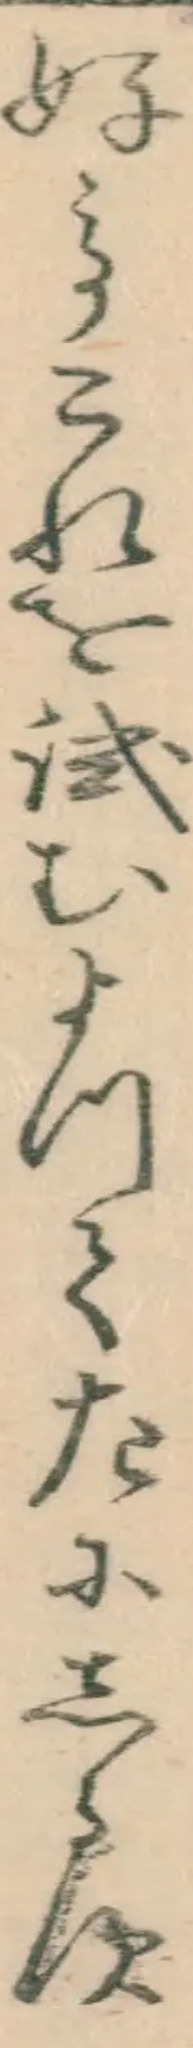好てこれを試むよつて左にしるす
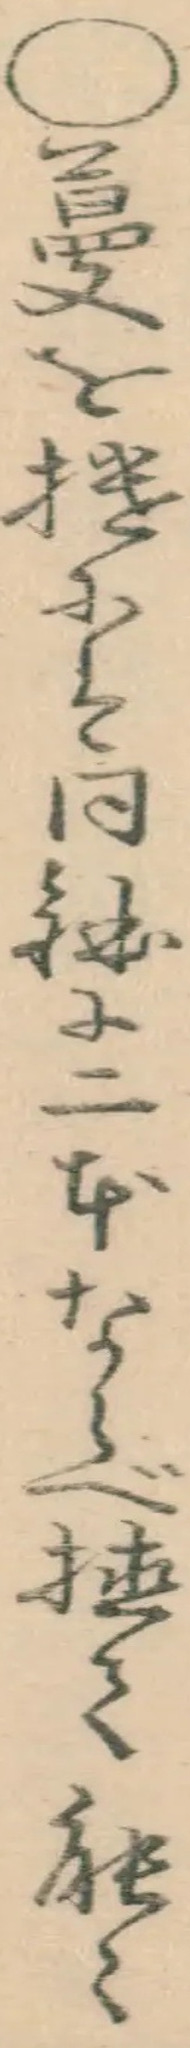〇蔓を継には同鉢に二本ならべ植て能々
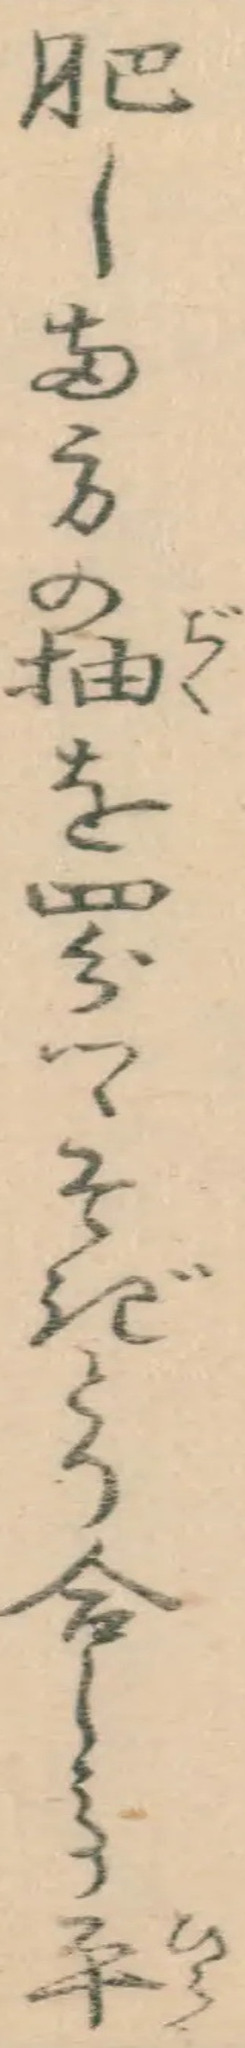肥し両方の柚を四分ツ丶そぎとり合して平
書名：花壇朝顔通 2巻. [2]
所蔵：国立国会図書館 National Diet Library, JAPAN
